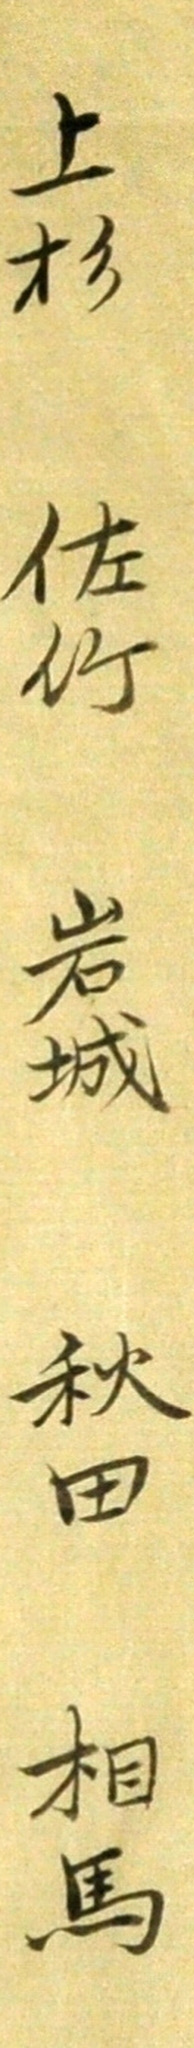上杉佐竹岩城秋田相馬
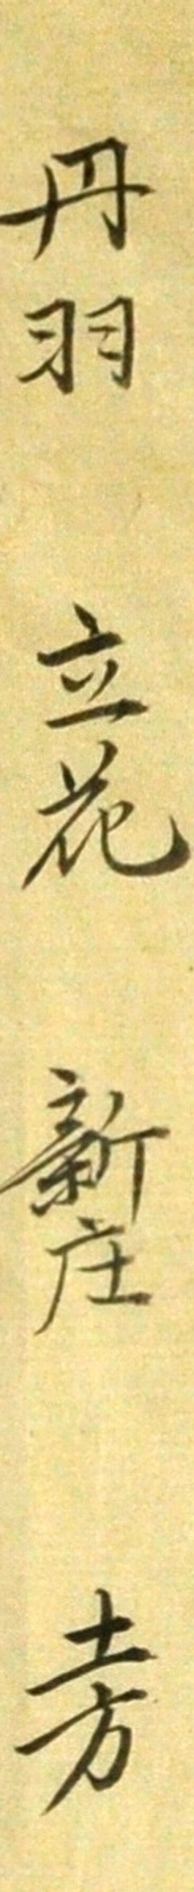丹羽立花新庄土方
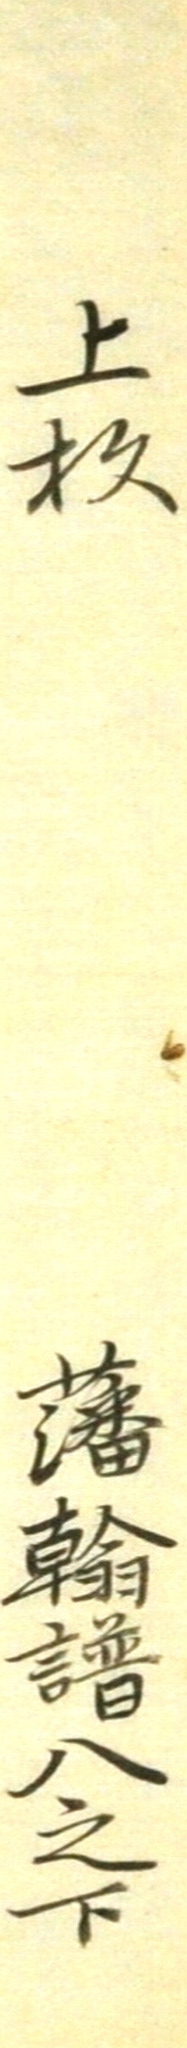上杉藩翰譜八之下
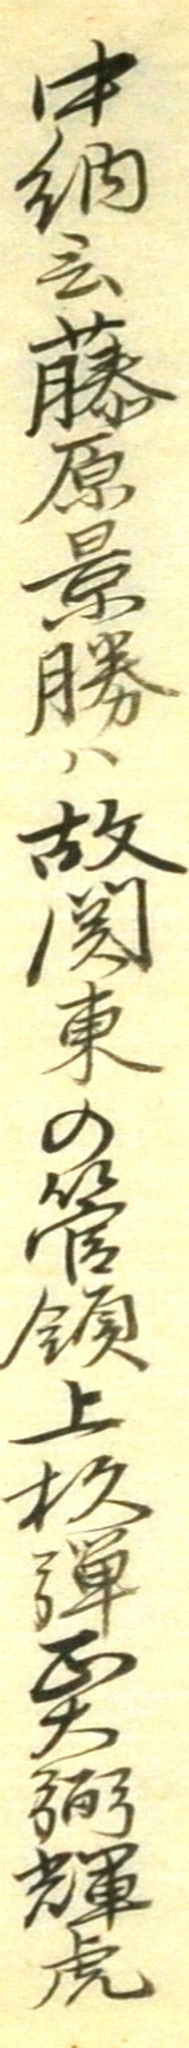中納言藤原景勝は故関東の管領上杉弾正大弼輝虎
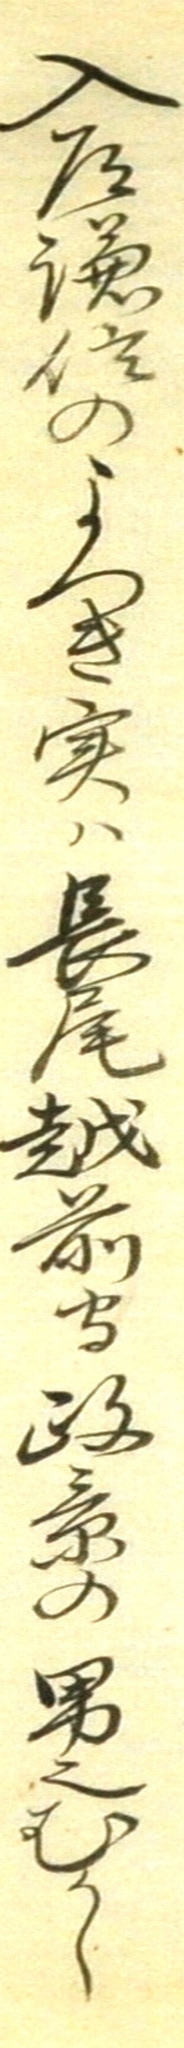入道謙信のよつき実は長尾越前守政景の男也むかし
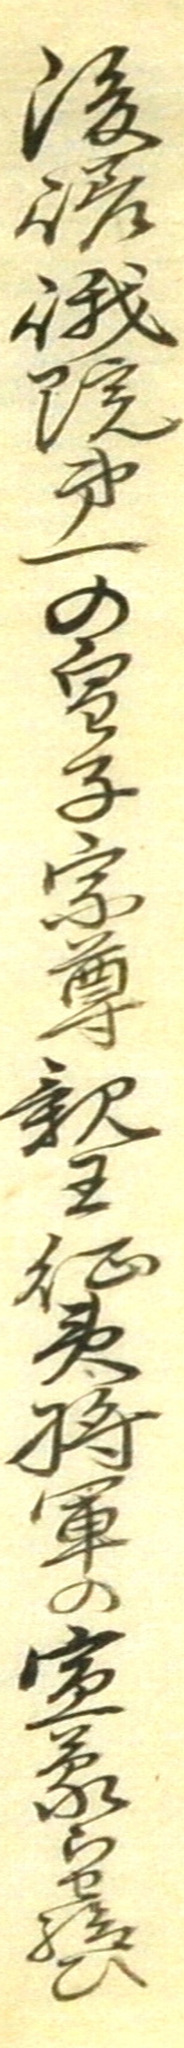後嵯峨院第一の皇子宗尊親王征夷将軍の宣蒙らせ給ひ
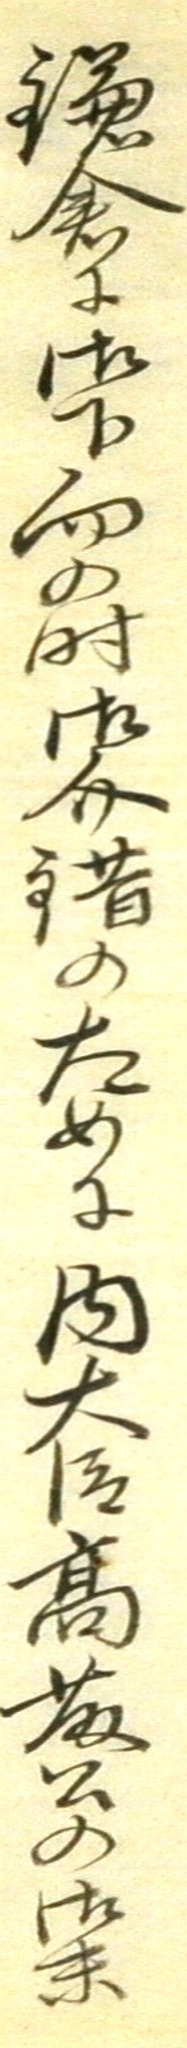鎌倉に御下向の時御介錯のために内大臣高藤公の御末
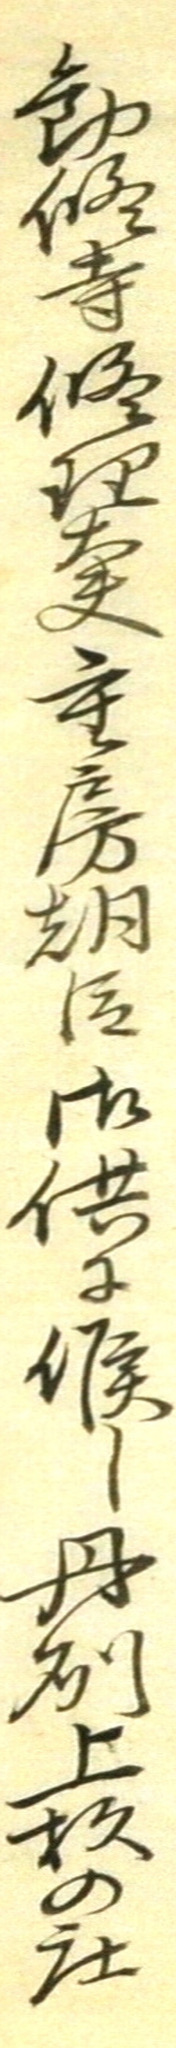勸修寺修理大夫重房朝臣御供に候し丹州上杉の庄
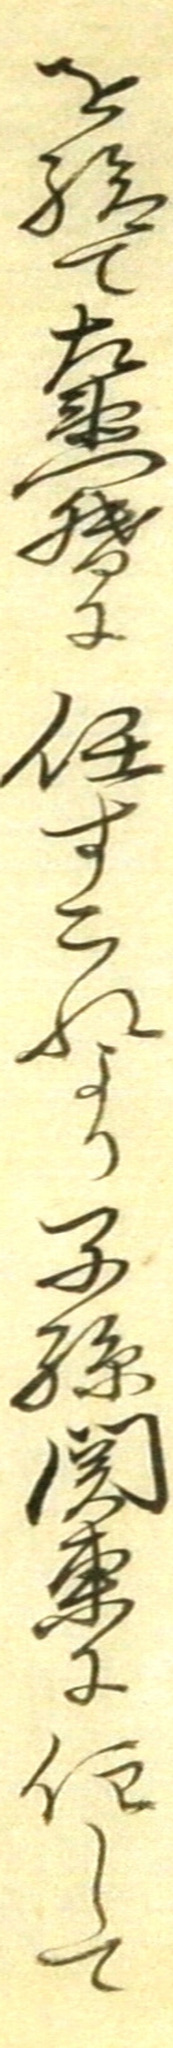を給て左衛門督に任すこれより子孫関東に住して
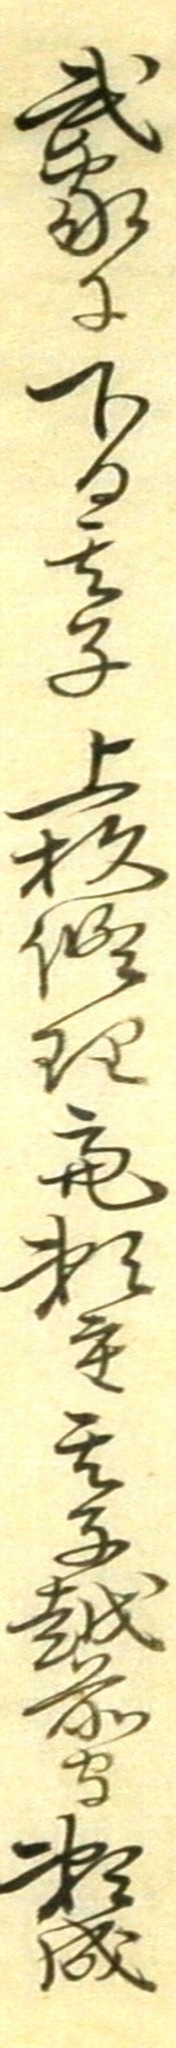武家に下る其子上杉修理亮頼重其子越前守頼成
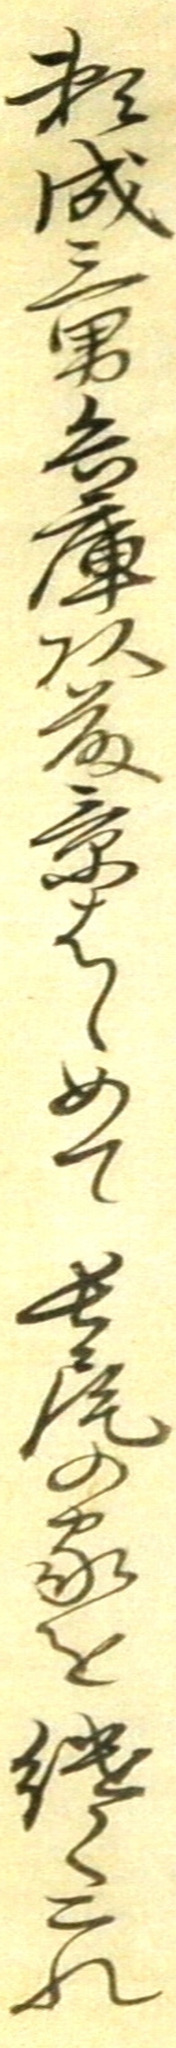頼成三男兵庫頭藤景はしめて長尾の家を継くこれ
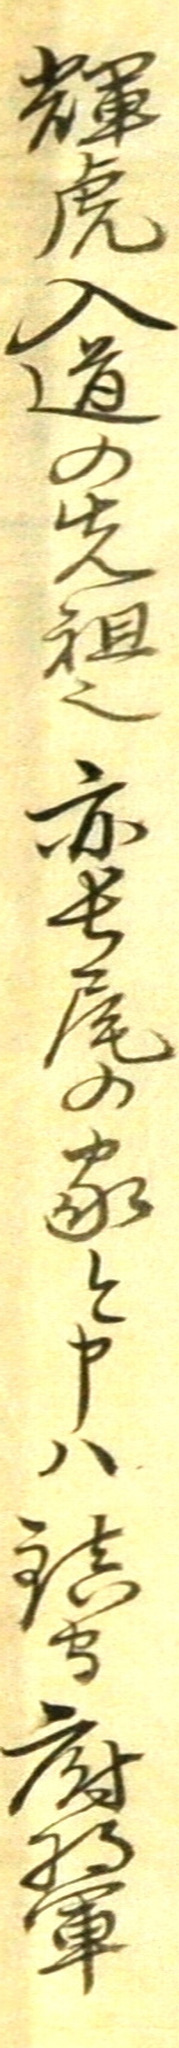輝虎入道の先祖也又長尾の家と申は鎮守府将軍

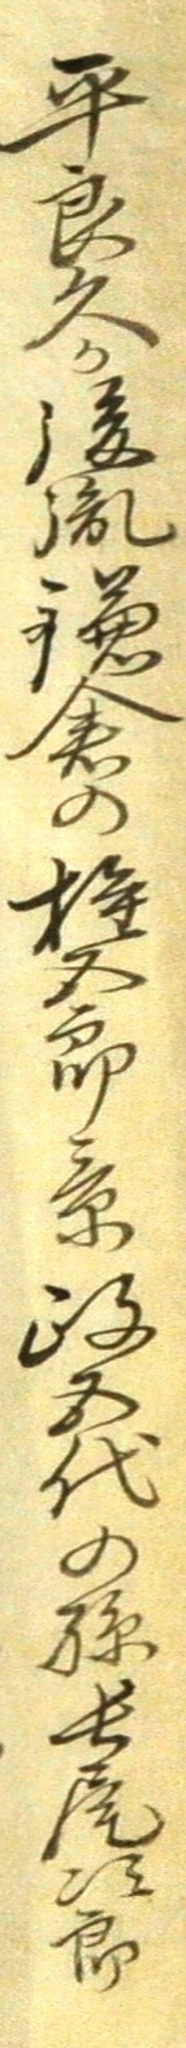平良久か後胤鎌倉の権五郎景政五代の孫長尾次郎
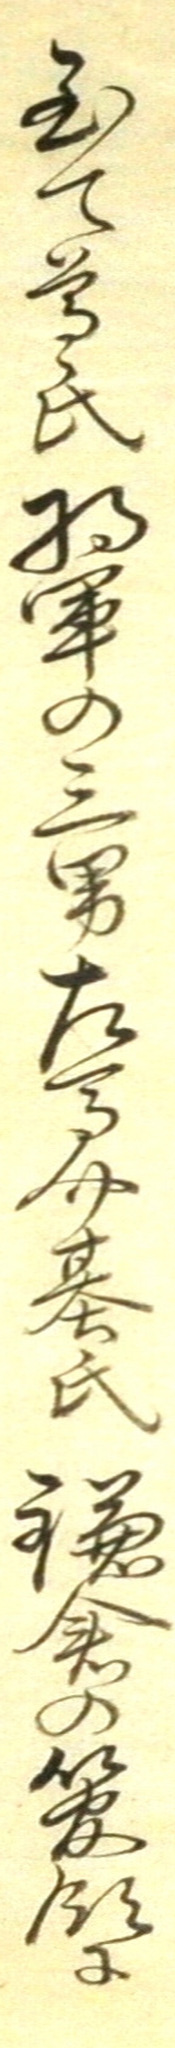至て尊氏将軍の三男左馬介基氏鎌倉の管領に
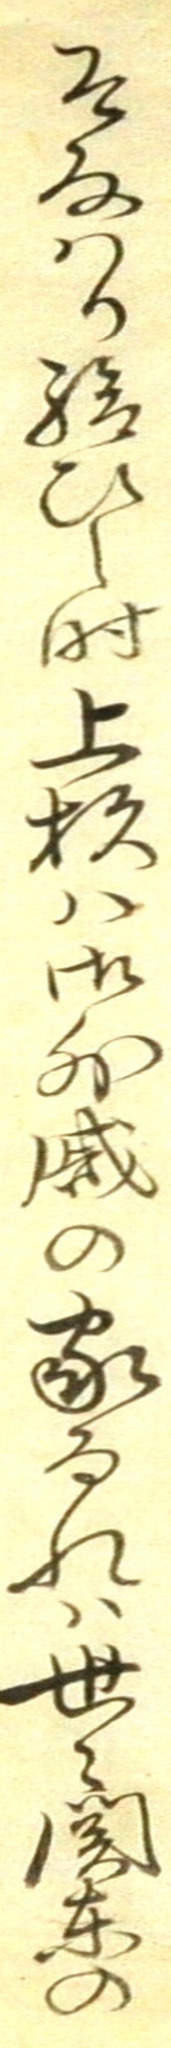そなはり給ひし時上杉は御外戚の家なれは世々関東の
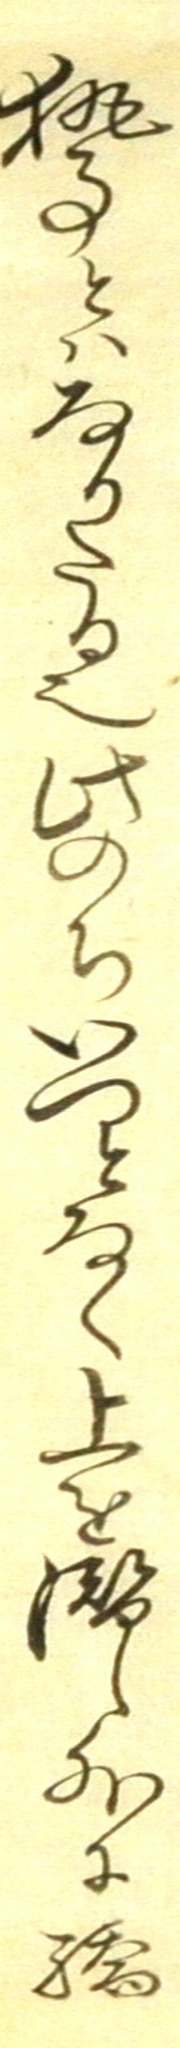執事とはなりたる也此のちいつとなく上を潜し外に驕
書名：藩翰譜（八・下）
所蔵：伊那市立高遠町図書館・合同会社AMANE
